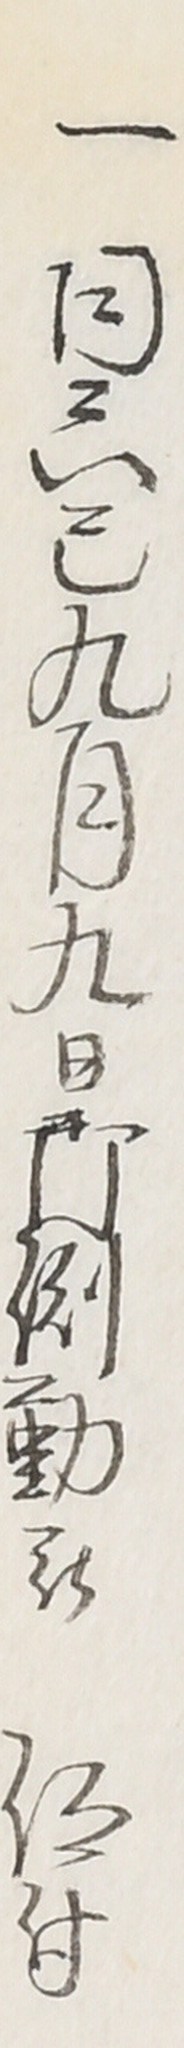一同六巳九月九日御側勤被仰付
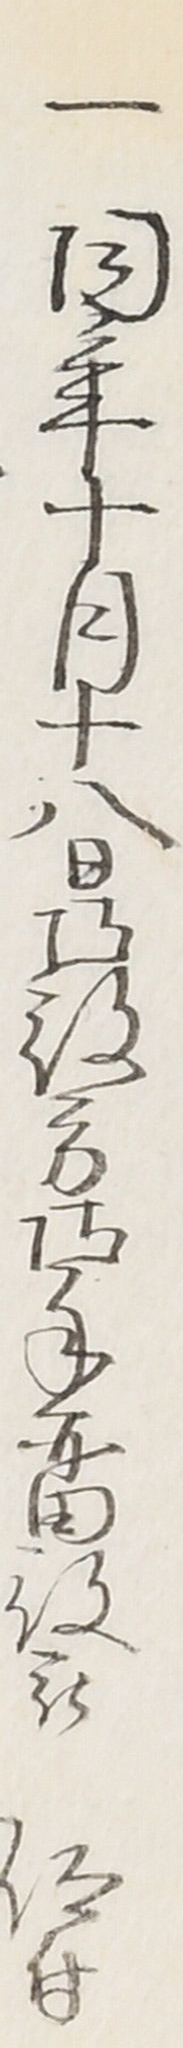一同年十月十八日御役方御手留役被仰付
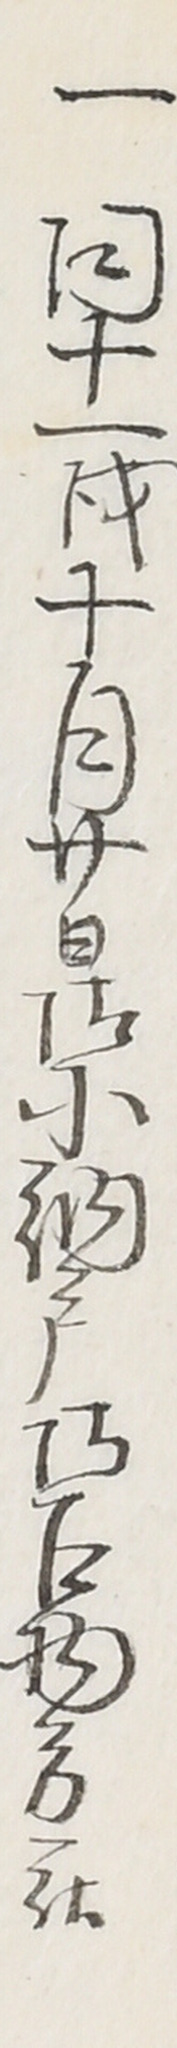一同十一戌十月廿日御小納戸御召物方被
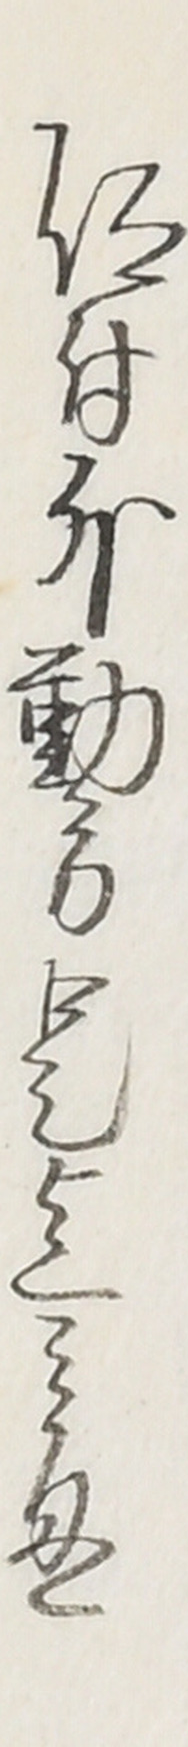仰付外勤方是迄之通
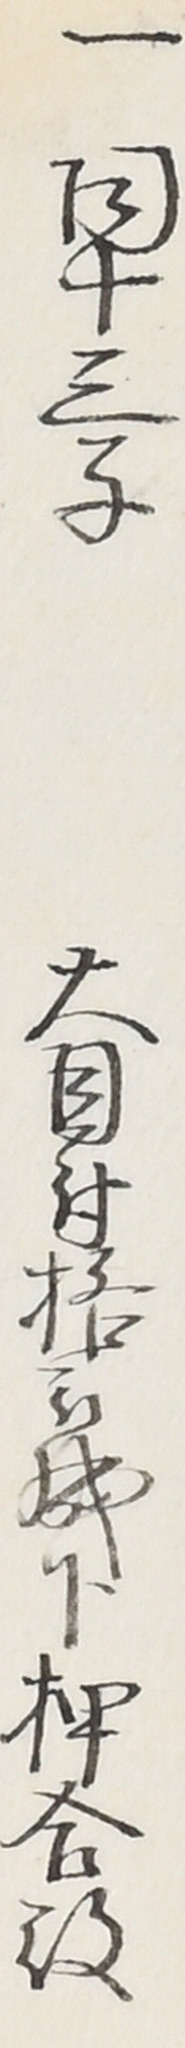一同十三子大目付格被成下押合役
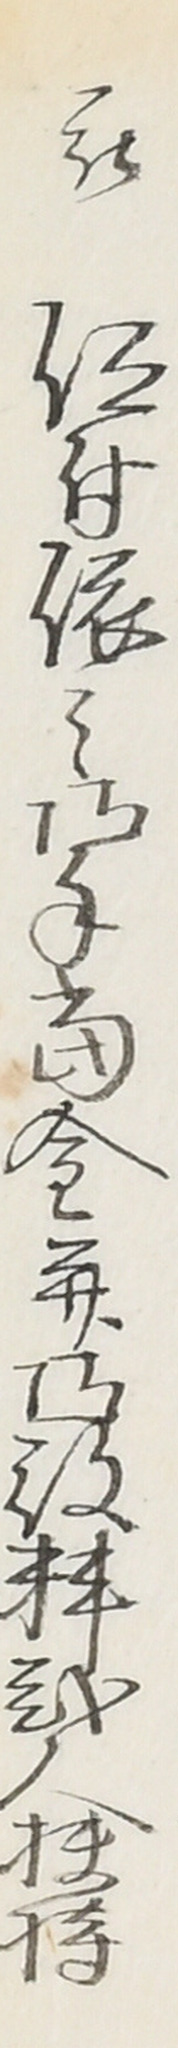被仰付依之御手当金并御役料弐人扶持
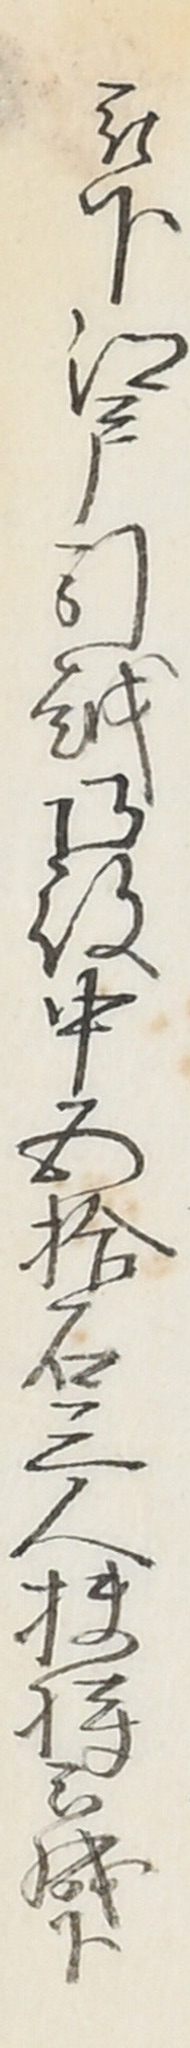被下江戸引越御役中五拾石三人扶持被成下
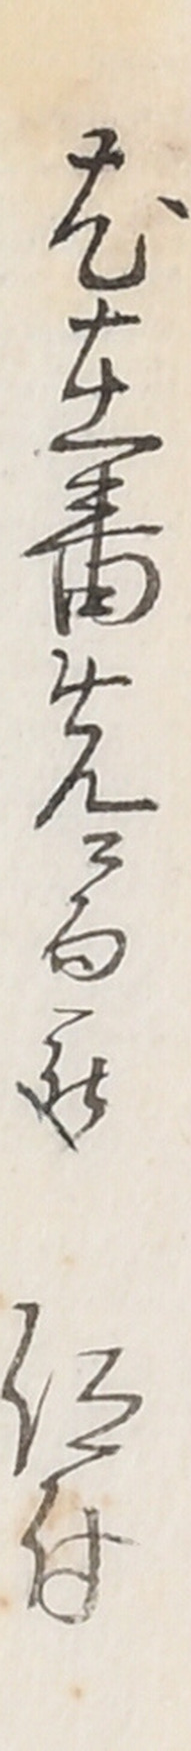尤在番先ニ而被仰付
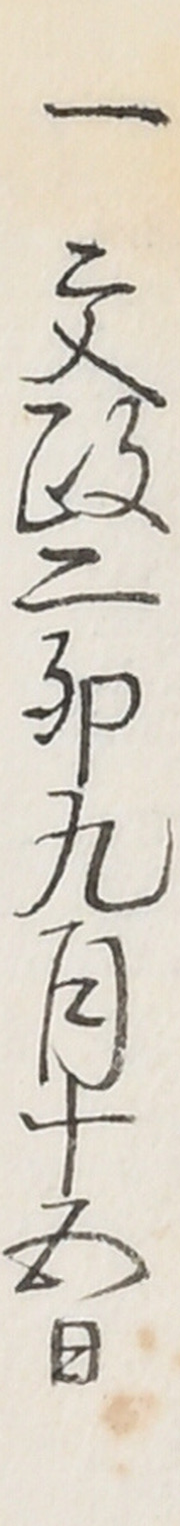一文政二卯九月十五日
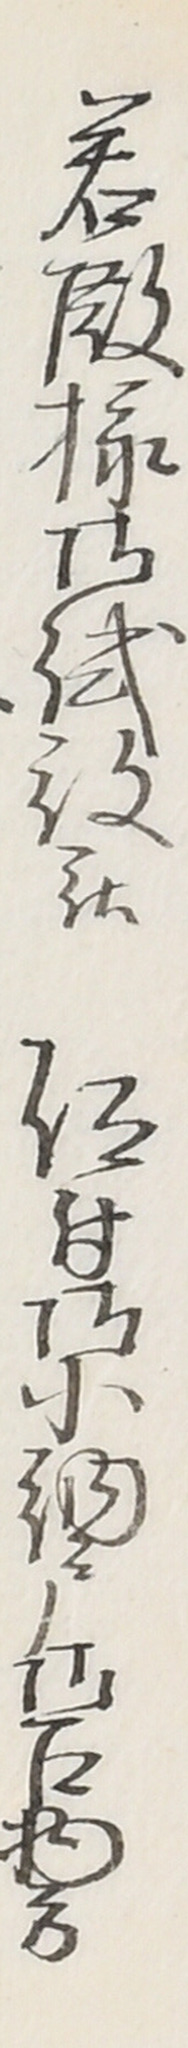若殿様御試役被仰付御小納戸御召物方
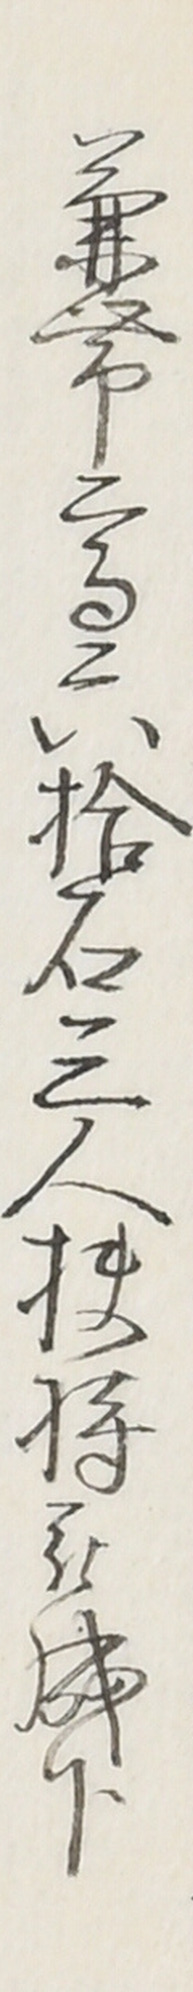兼帯高六拾石三人扶持被成下
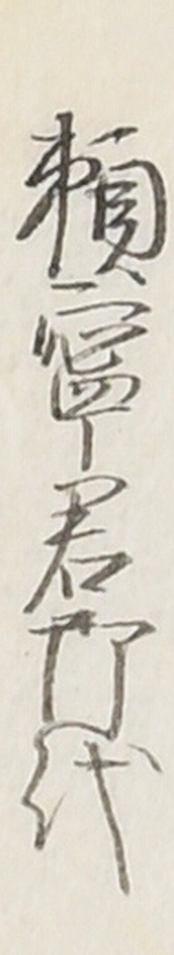頼寧君御代
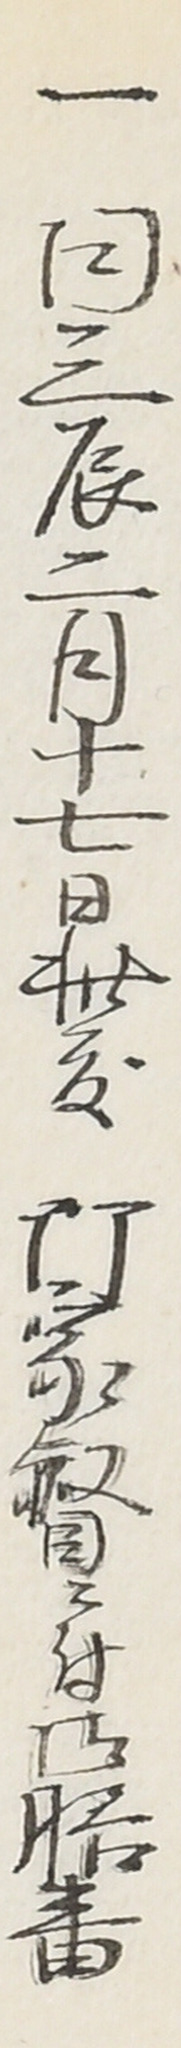一同三辰二月十七日此度御家督ニ付御膳番
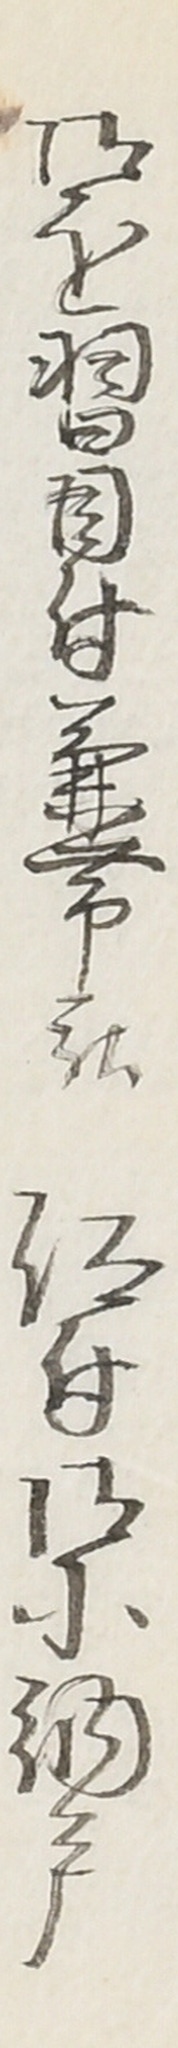御近習目付兼帯被仰付御小納戸
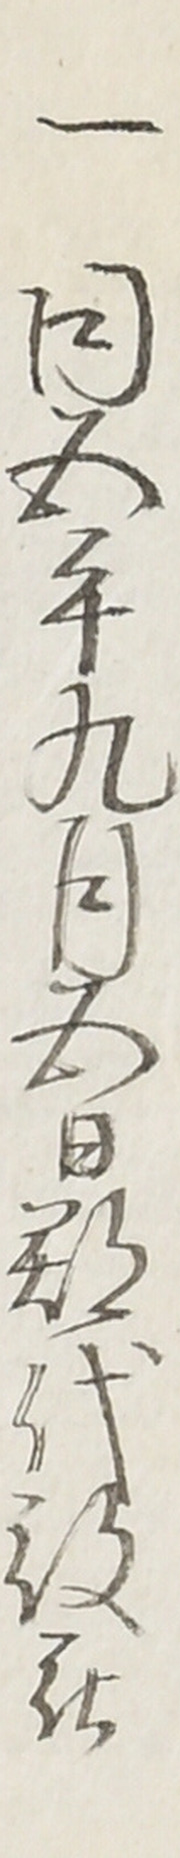一同五午九月五日郡代役被
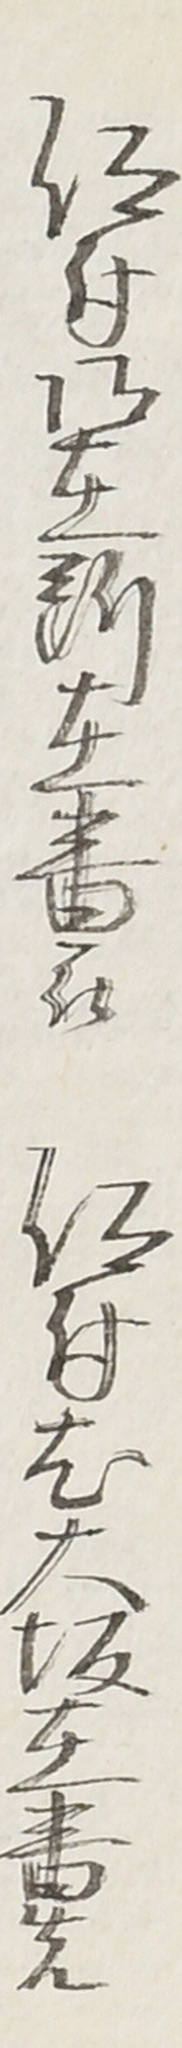仰付御在所在番被仰付尤大坂在番先
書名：給人諸士勤仕録（七）
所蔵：伊那市立高遠町図書館・合同会社AMANE
